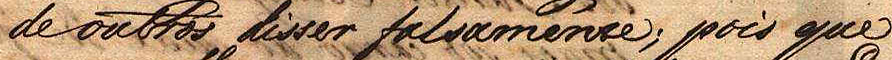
de outros disser falsamente; pois que
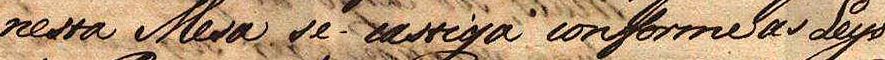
nesta Mesa se-castiga conforme as Leys
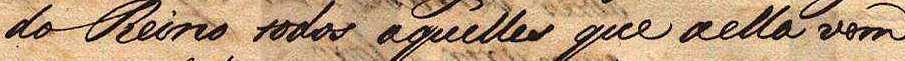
do Reino todos aquelles que a ella vem
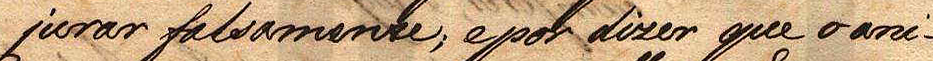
jurar falsamente; e por dizer que o ani
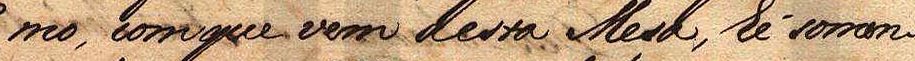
mo, com que vem desta Mesa, hé somen
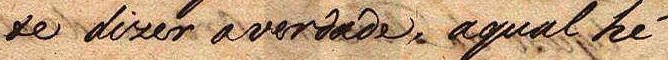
te dizer a verdade, a qual hé
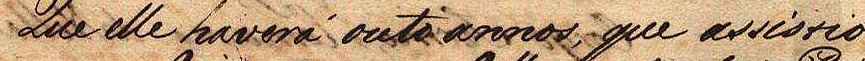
Que elle haverá outo annos, que assistio
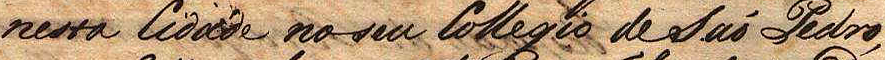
nessa Cidade no seu Collegio de Saõ Pedro,
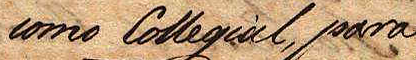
como Collegial, para
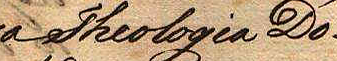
a Theologia Do
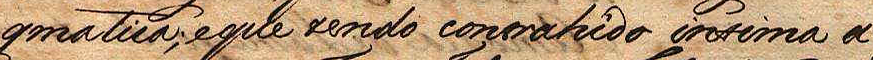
gmatica; e que zendo contrahido intima a
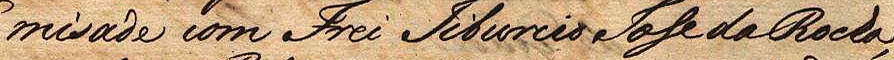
misade com Frei Tiburcio Jose da Rocha,
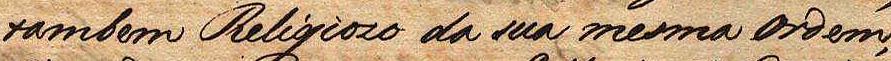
tambem Religiozo da sua mesma Ordem,
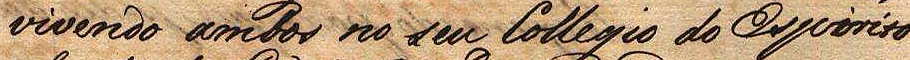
vivendo ambos no seu Collegio do Espirito
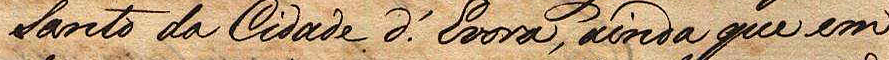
Santo da Cidade d'Evora, ainda que em
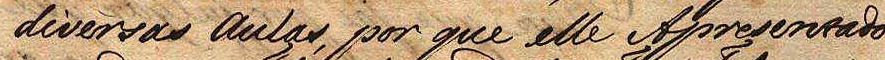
diversas aulas, por que elle Apresentado
